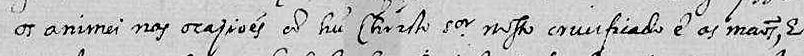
os animei nas ocazioẽs cō hū Christo s.or nosso crucificado ē as maõs, E
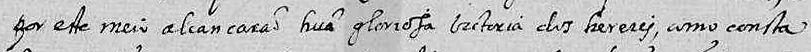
por este meio alcançaraõ huā gloriosa victoria dos hereies, como consta
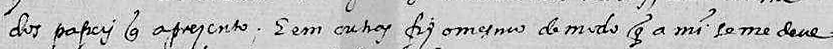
dos papeis q̄ aprezento. E em outras fiz o mesmo de modo q̄ a mī se me deue
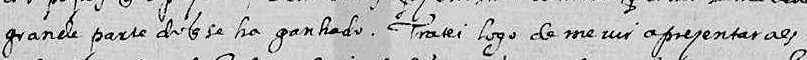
grande parte do q̄ se ha ganhado. Tratei logo de me uir aprezentar a es
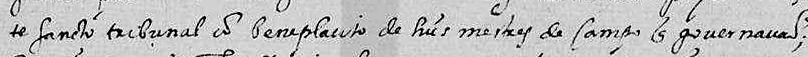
te sancto tribunal cō beneplacito de hūs mestres de Campo q̄ gouernauaõ,
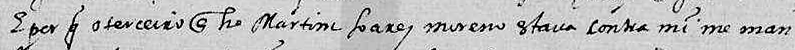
E porq̄ o terceiro q̄ he Martim Soares moreno estaua contra mī me man
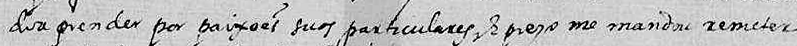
dou prender por paixoẽs suas particulares, E prezo me mandou remeter
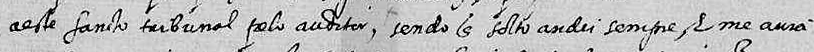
a este sancto tribunal pelo auditor, sendo q̄ solto andei sempre, E me auia
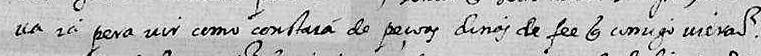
ua ia pera uir como constará de peçoas dinas de fee q̄ comigo uieraõ.
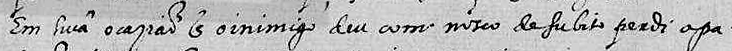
Em huā ocaziaõ q̄ o inimigo deu comnosco de subito perdi a pa
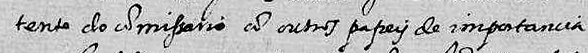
tente do cōmissario cō outros papeis de importancia.
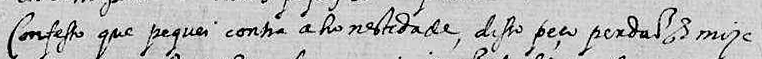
Confesso que pequei contra a honestidade, disso peço perdaõ E mize
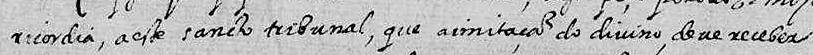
ricordia, a este sancto tribunal, que a imitaçaõ do diuino deue receber
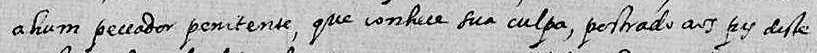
a hum peccador penitente, que conhece sua culpa, postrado aos pes deste
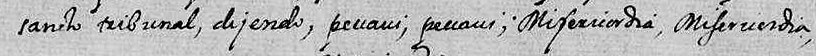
sancto tribunal, dizendo, peccaui; peccaui; Misericordia, Misericordia,
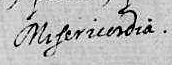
Misericordia.
